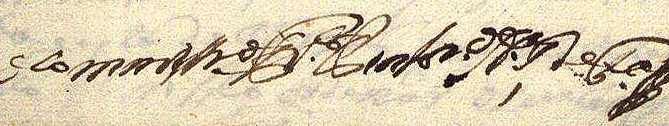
e commissro Fr.co Pinhr.o s.tos de F.a
